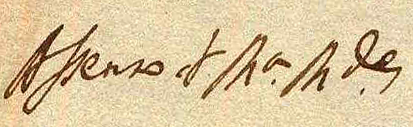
Assento d̄ M.a M.des
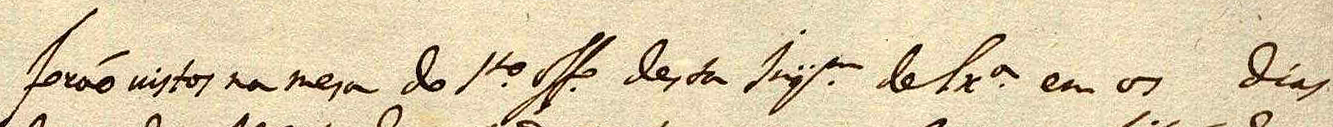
foraõ uistos na mesa do s.to off.o desta Inq.m de lx.a em os dias
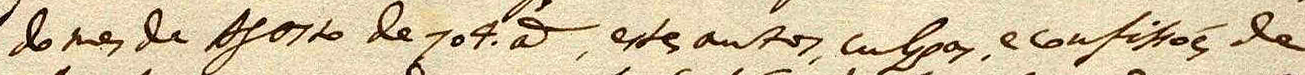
do mes de Agosto de 704. ā , este autos, culpas e confissoẽs de
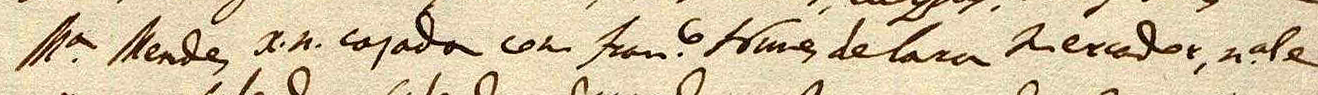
Ma. Mende x. n. cazada com fran.co Nunes de lara mercador, n.al e
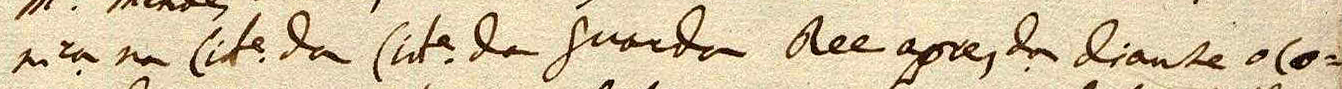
mra na Cide. da Cide. da Guarda Ree aprez.da diante o Co
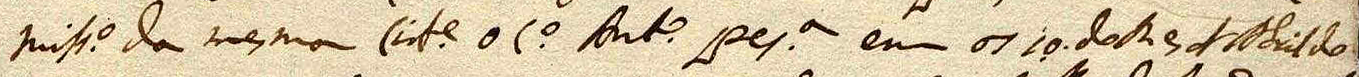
miss.o da mesma Cid.e o C.o Ant.o pes.a em os 10. do Mes de Abril do
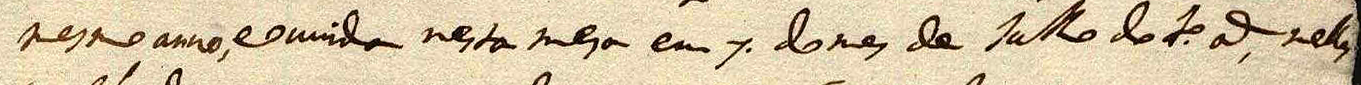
mesmo anno, e ouuida nesta meza em 7. do mes de Iulho do d.o ā nelles
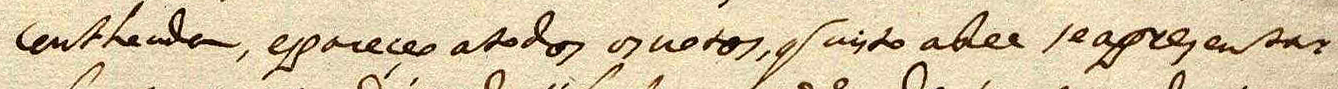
contheuda, e pareceo a todos os uotos, q̄ uisto a Ree se aprezentar
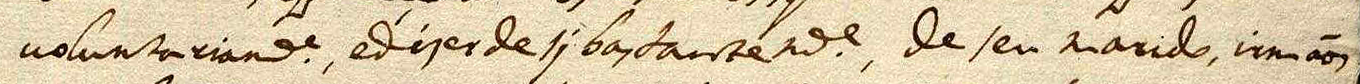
uoluntariam.te, e dizer de sj bastantem.te, de seu marido, irmaõs
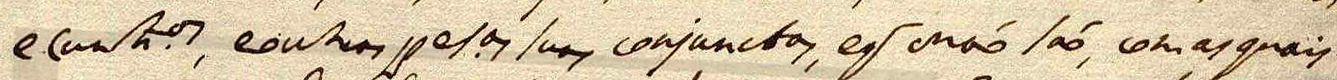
e Cunh.os, e outras pes.as suas conjunctas, e q̄ o naõ saõ, com as quais
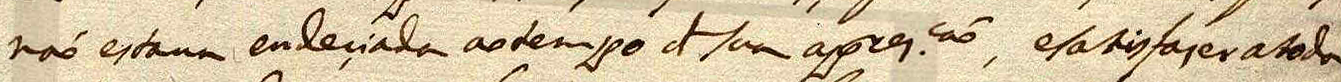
naõ estaua endeciada ao tempo d̄ sua aprez.çaõ, e satisfazer a toda
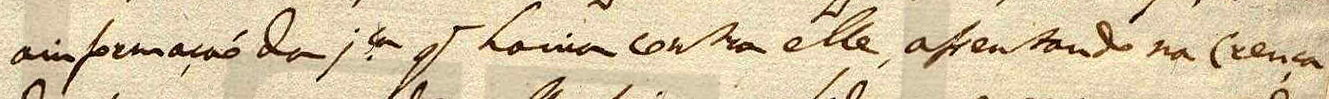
a informaçaõ da j.ça q̄ hauia contra elle, assentando na Crença
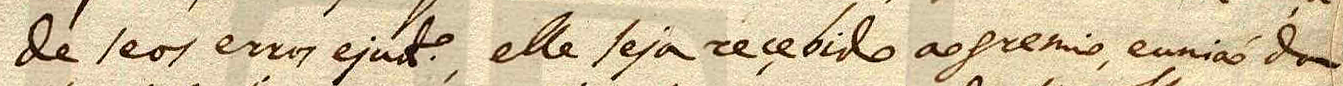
de seos erros e jud̄.o elle seja recebido ao gremio, e uniaõ da
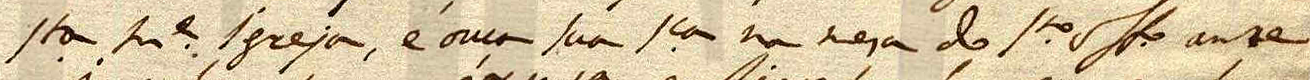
st.a me. Igreja, e ouça sua s.ça na mesa do sto off.o ante
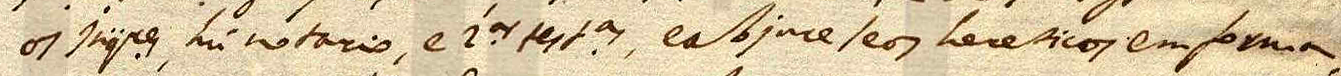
os Inq.res, hū notario, e 2.as test.as, e abjure seos hereticos em forma
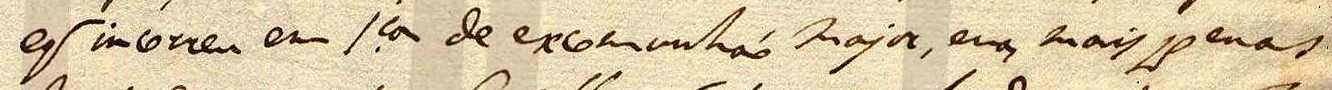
e q̄ incorreu em s.ça de excomunhaõ major, e nas mais penas
